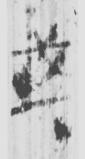{戈土}
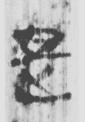是
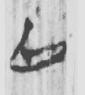㠯（以）
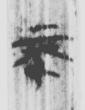不
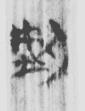型
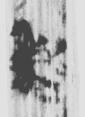殺
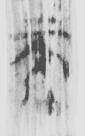而
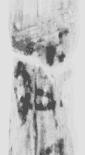攸
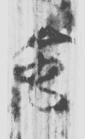{宀𠁩}
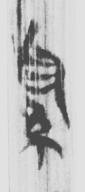紿
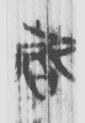者
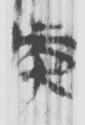侯
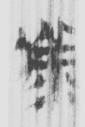備
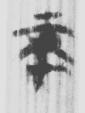不
